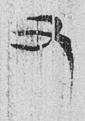又（有）
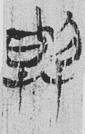與（舉）
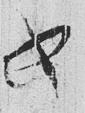女（汝）
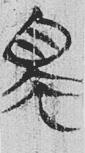蜀（獨）
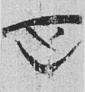正
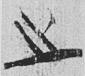之
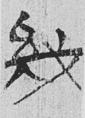幾（豈）
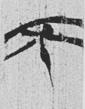不
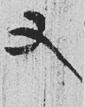又（有）
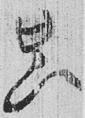也
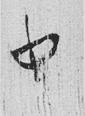中
